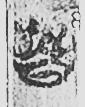晉
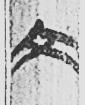文
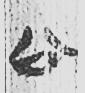公
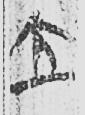立
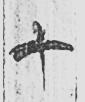七
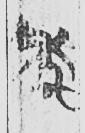年
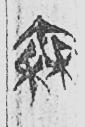秦
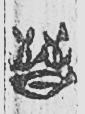晉
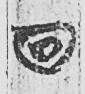回
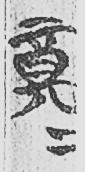奠=
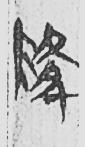降
